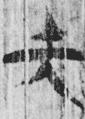○（堯）
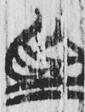爲
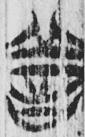善
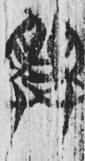興
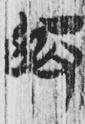臤（賢）
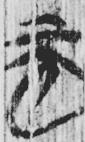而
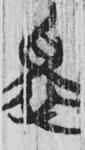卒B
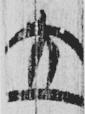立
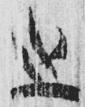之
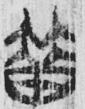昔
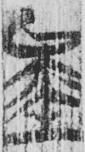○（舜）
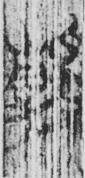靜（耕）
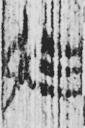於
